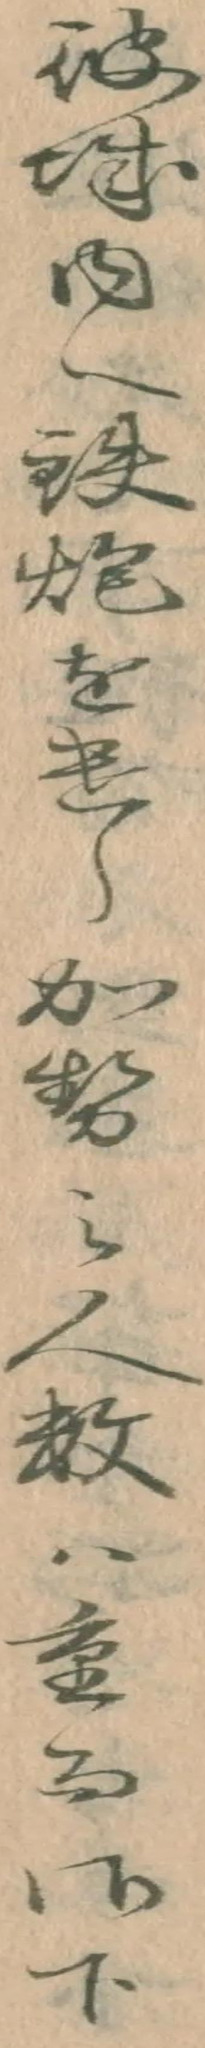彼城内へ鉄炮を遣し加勢之人数は重而御下
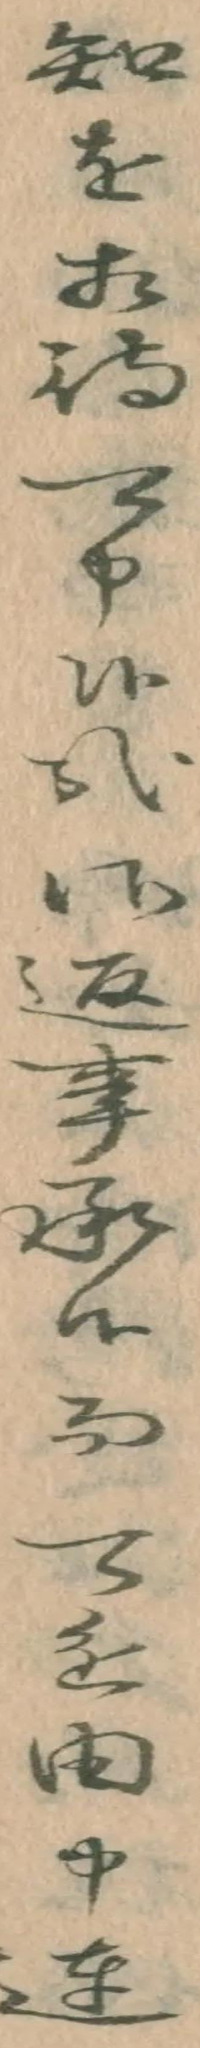知を相尋可申候哉御返事承候而可進由申達
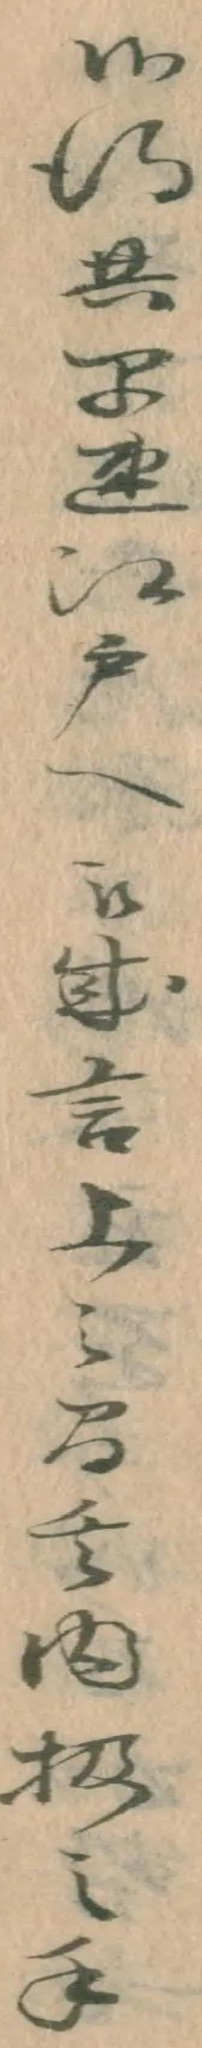候得共早速江戸へ被成言上之間其内扱之手
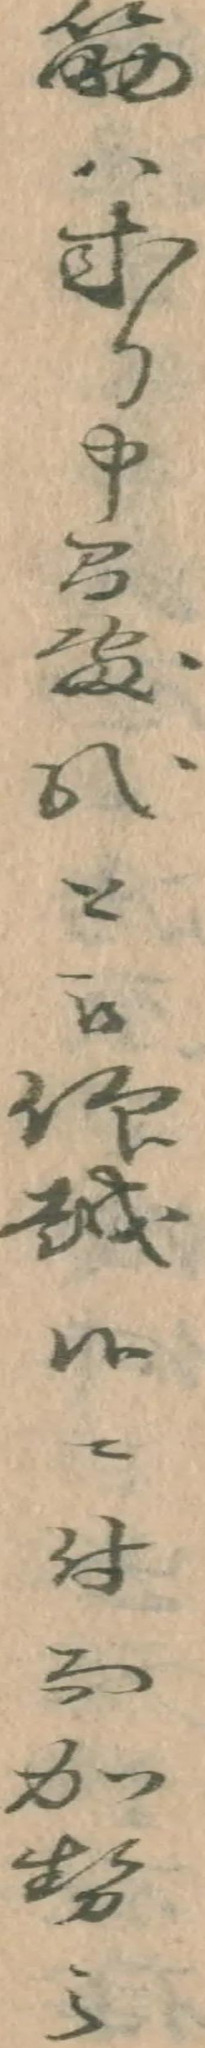筋は成り申間敷哉と被仰越候に付而加勢之
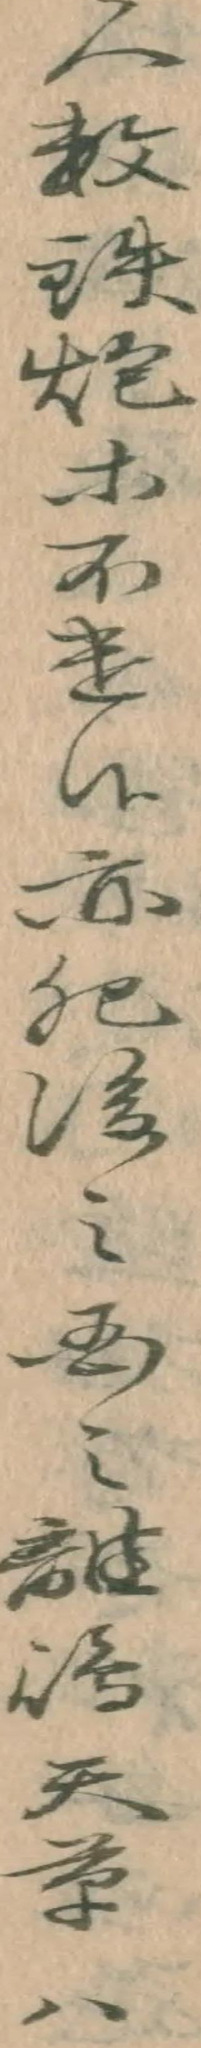人数鉄炮等不遣候亦肥後之国之離島天草は
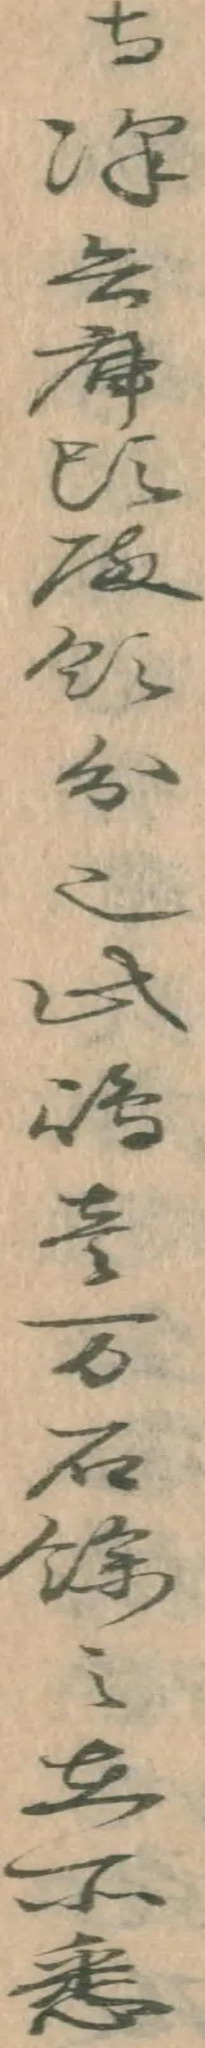寺沢兵庫頭殿領分也此島壱万石餘之在所悉
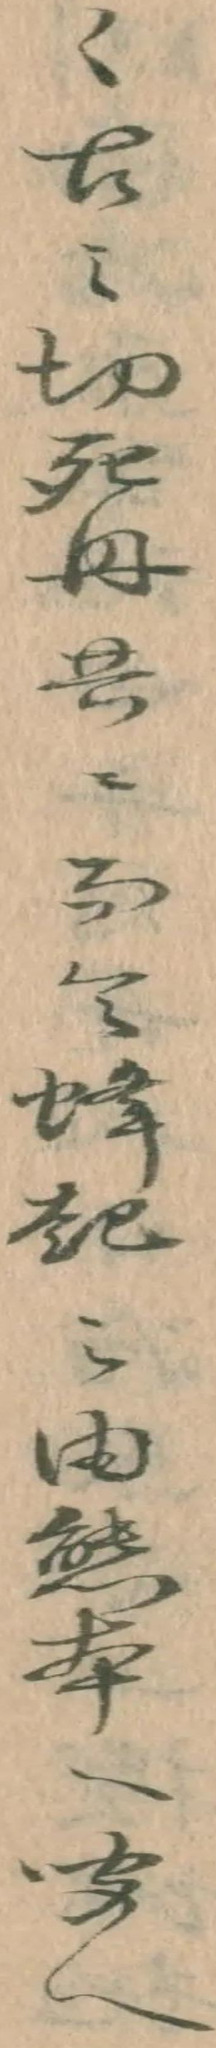く右之切支丹共に而令蜂起之由熊本へ聞へ
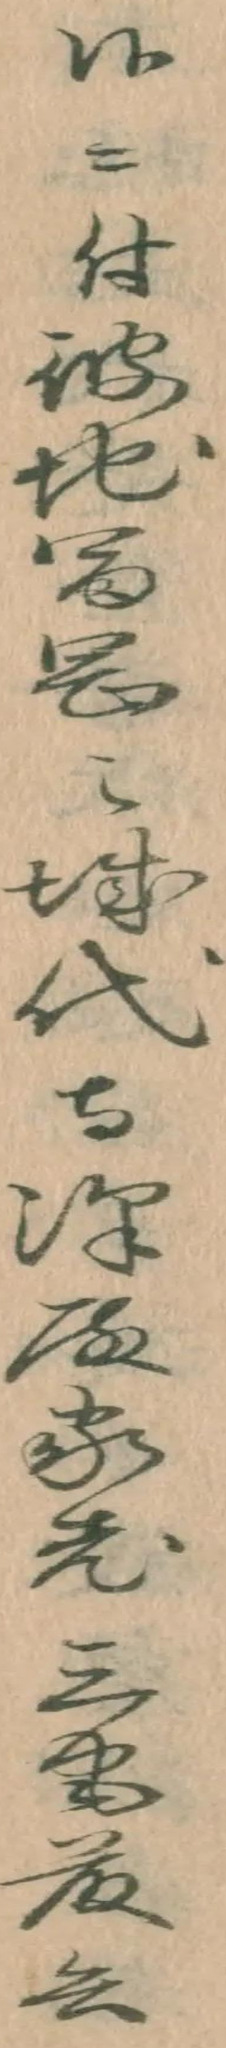候に付彼地冨岡之城代寺沢殿家老三宅藤兵
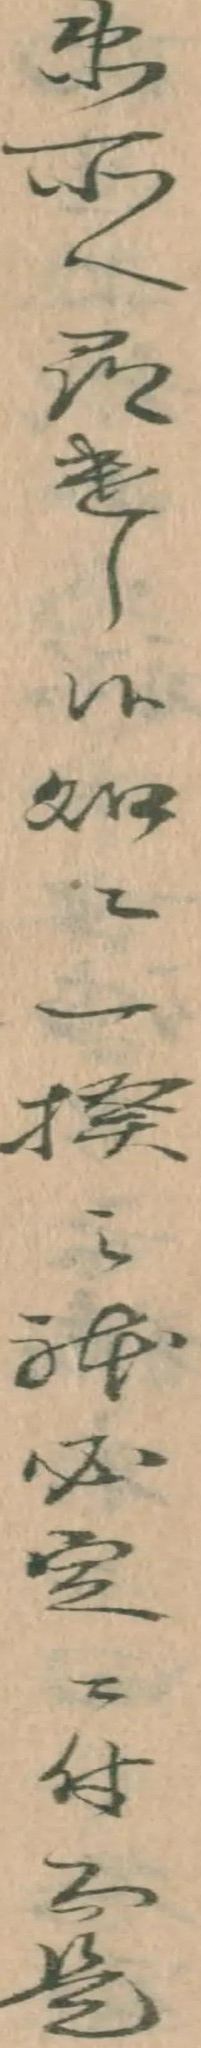衛所へ尋遣し候処に一揆之躰必定に付而是
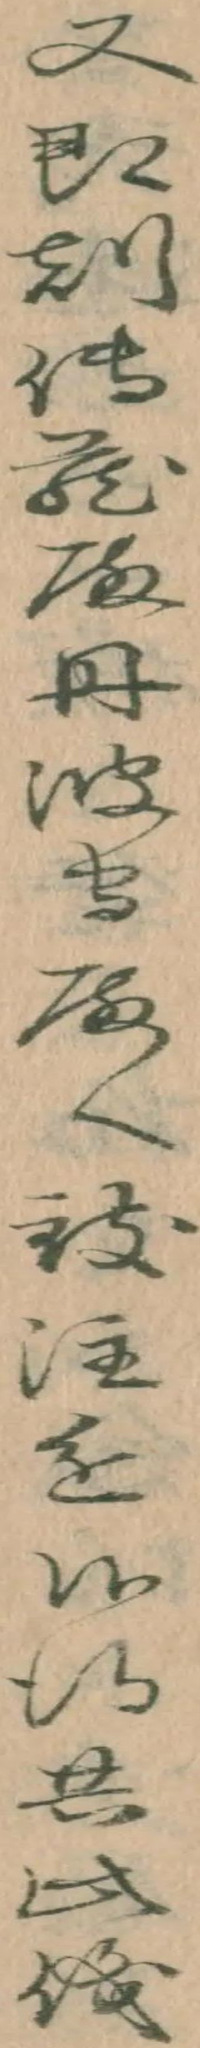又即刻伝蔵殿丹波守殿へ到注進候得共此儀
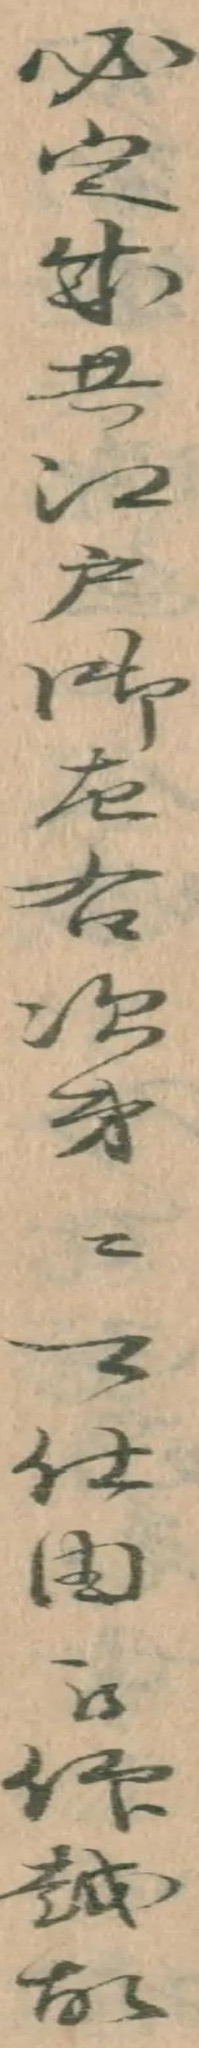必定成共江戸御左右次第に可仕由被仰越故
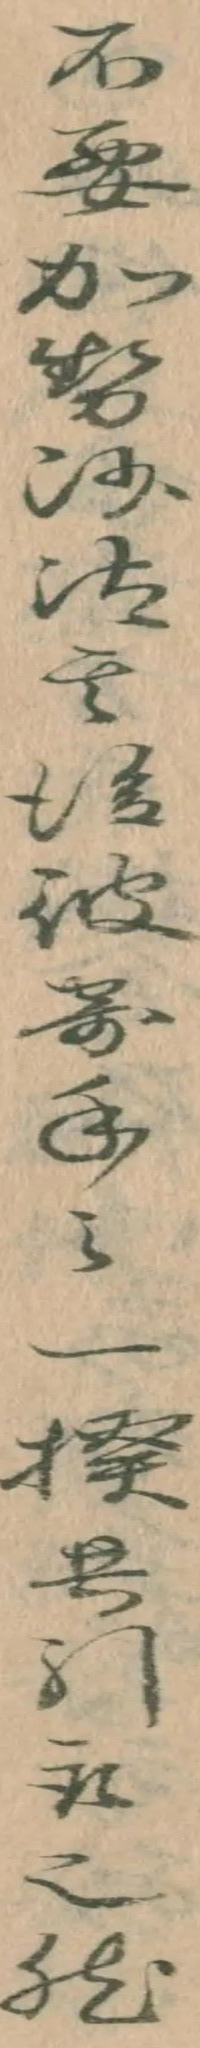不要加勢沙汰其後彼寄手之一揆共引取也然
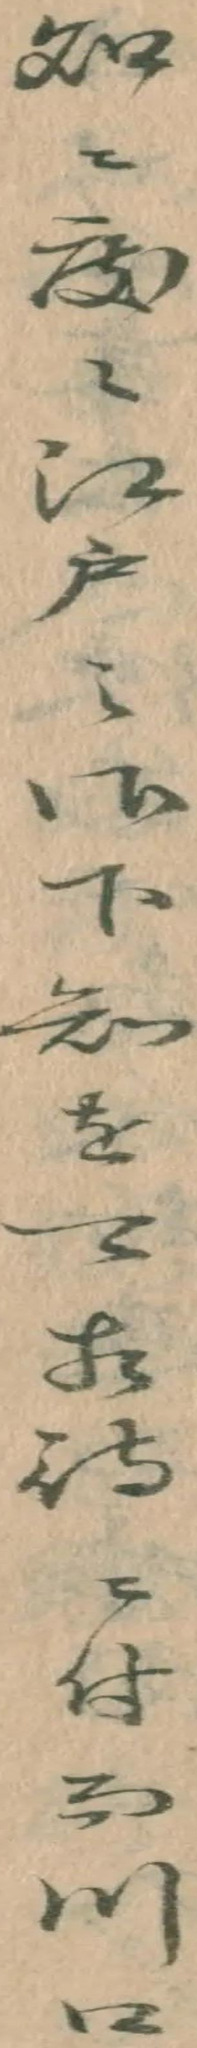処に度々江戸之御下知を可相待に付而川口
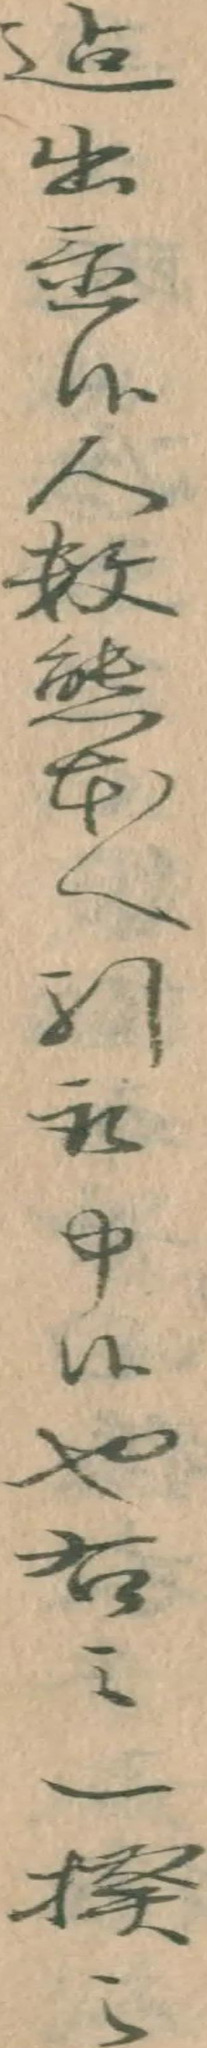迄出置候人数熊本へ引取申候也右之一揆之
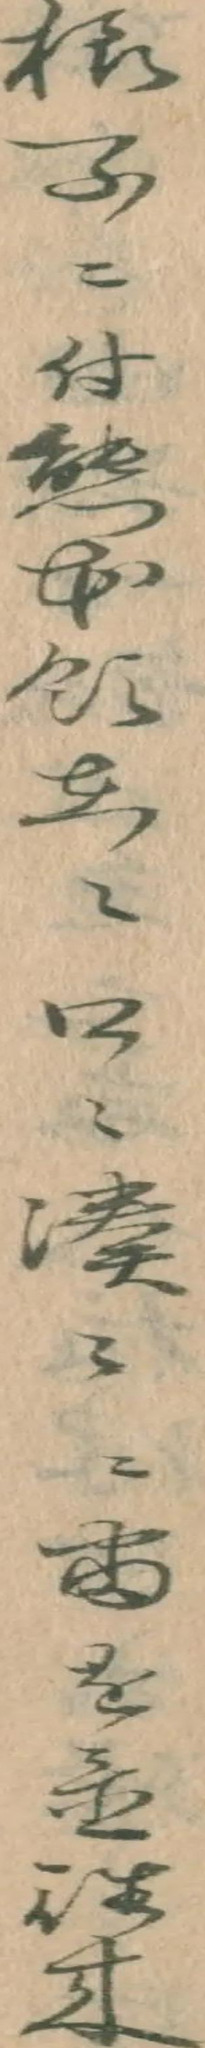様子に付熊本領在々口々湊々に番を置往来
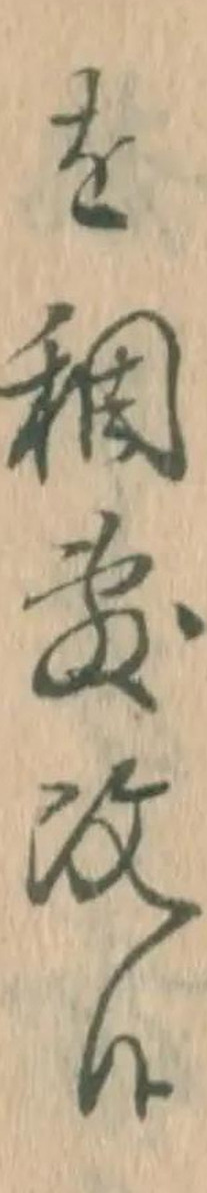を稠敷改候
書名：切支丹御退治記 49巻. [2]
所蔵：国立国会図書館 National Diet Library, JAPAN
